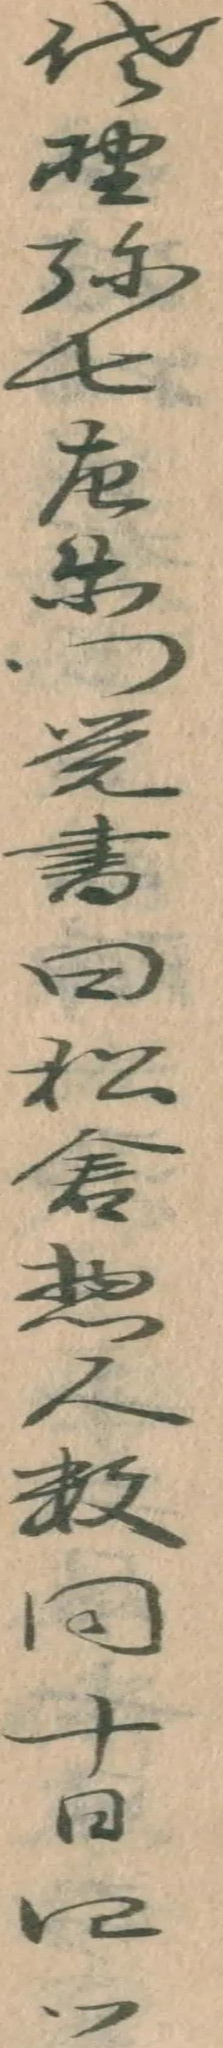佐野弥七左衛門覚書曰松倉惣人数同十日四つ
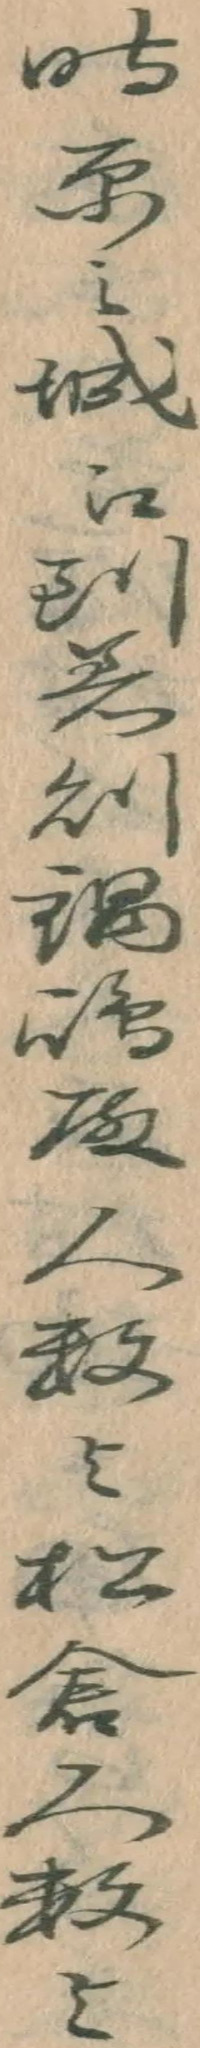時原之城江到着則鍋島殿人数与松倉人数与
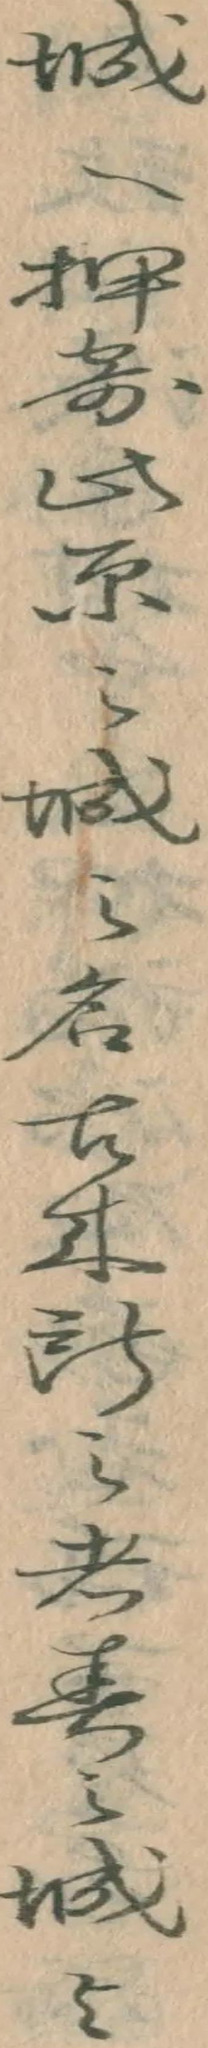城へ押寄此原之城之名古来新之者春之城与
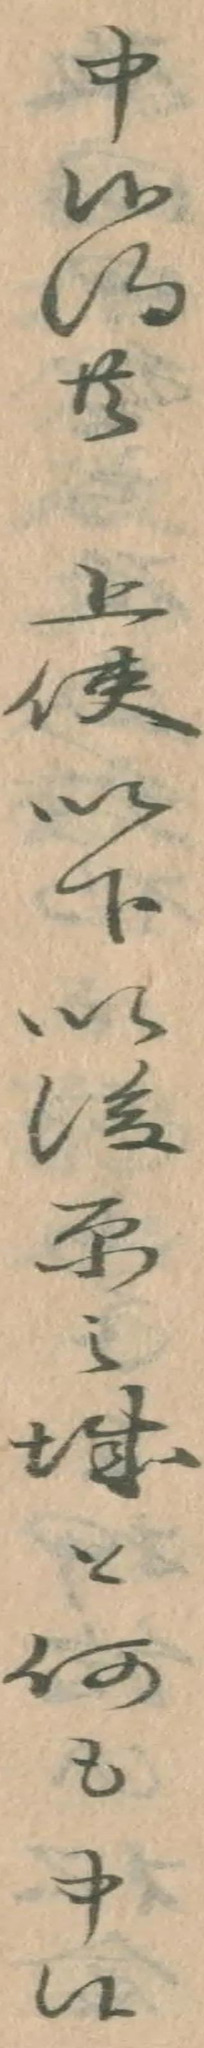申候得共上使以下以後原之城と何も申候
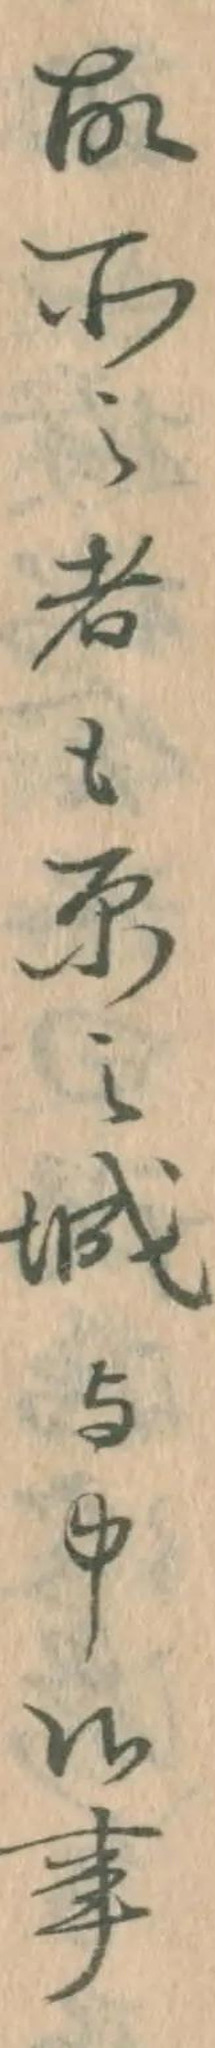故所之者も原之城与申候事

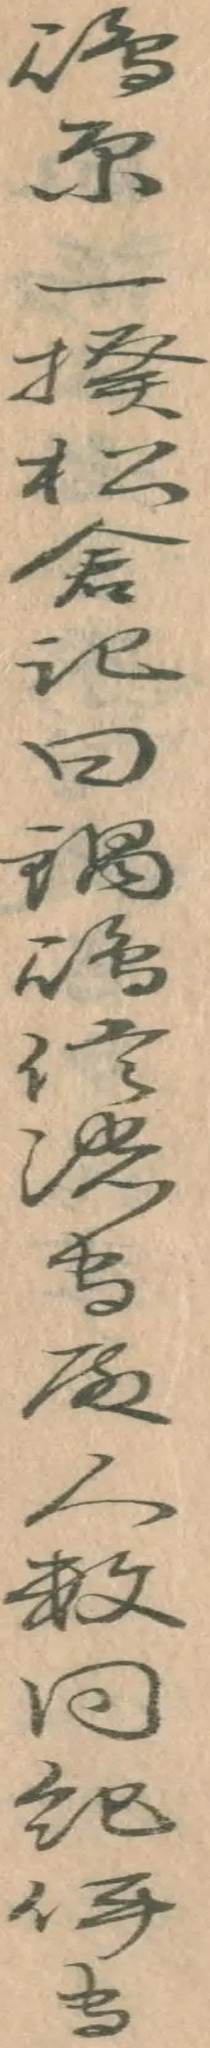島原一揆松倉記曰鍋島信濃守殿人数同紀伊守
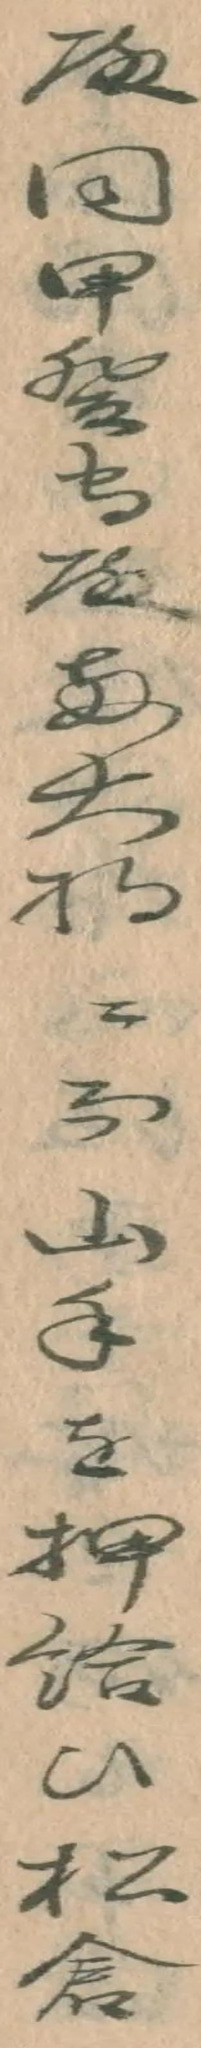殿同甲斐守殿両大将に而山手を押給ひ松倉
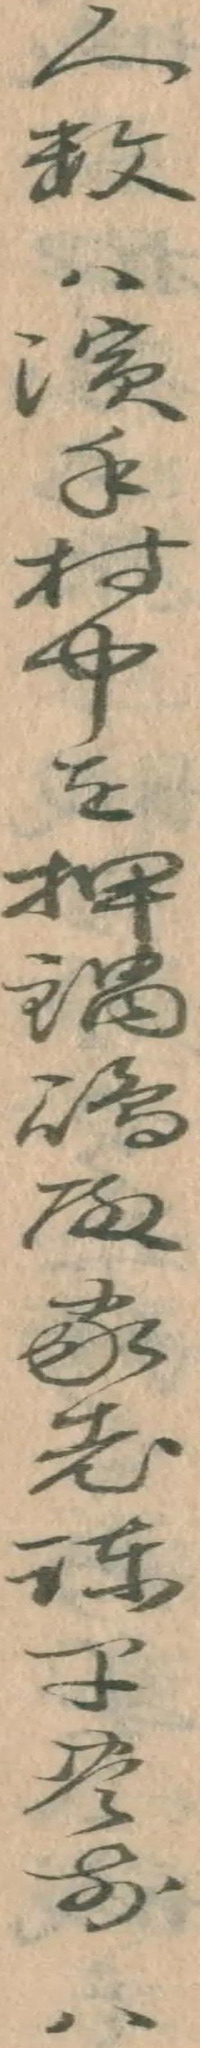人数は浜手村中を押鍋島殿家老諫早豊前は
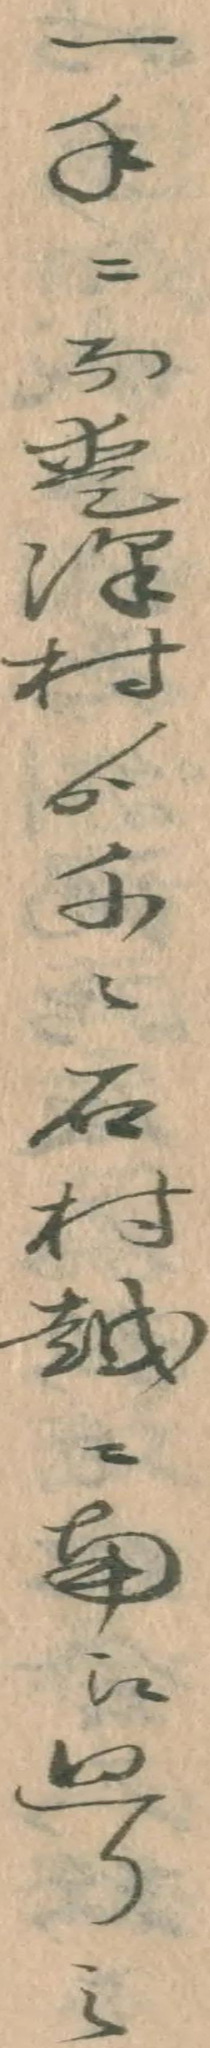一手に而愛沢村ゟ千々石村越に南江廻り之
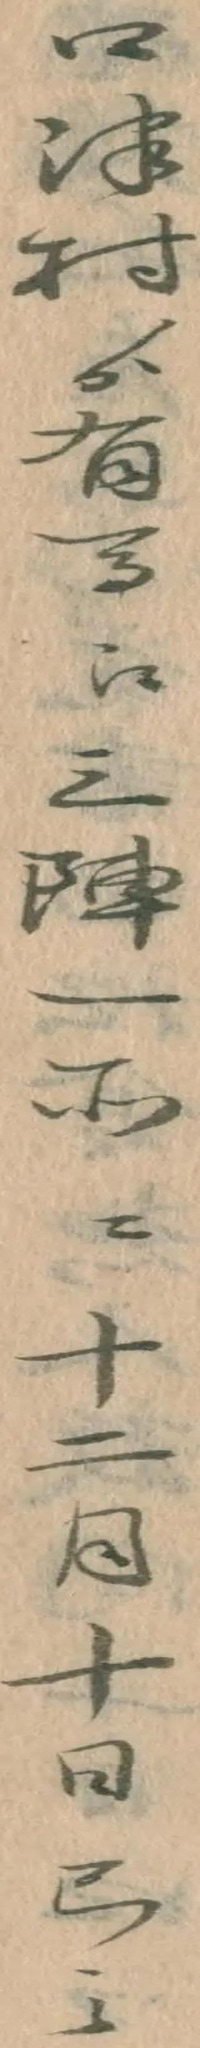口津村ゟ有馬江三陣一所に十二月十日巳之
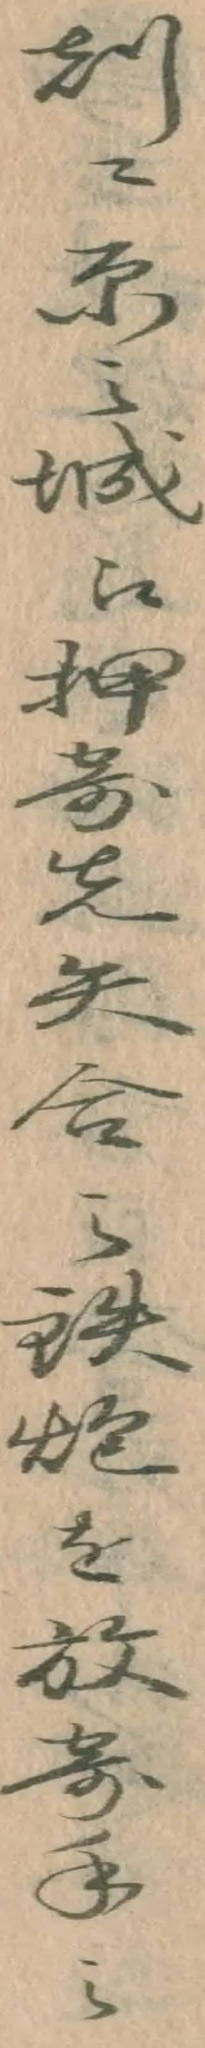刻に原之城江押寄先矢合之鉄炮を放寄手之
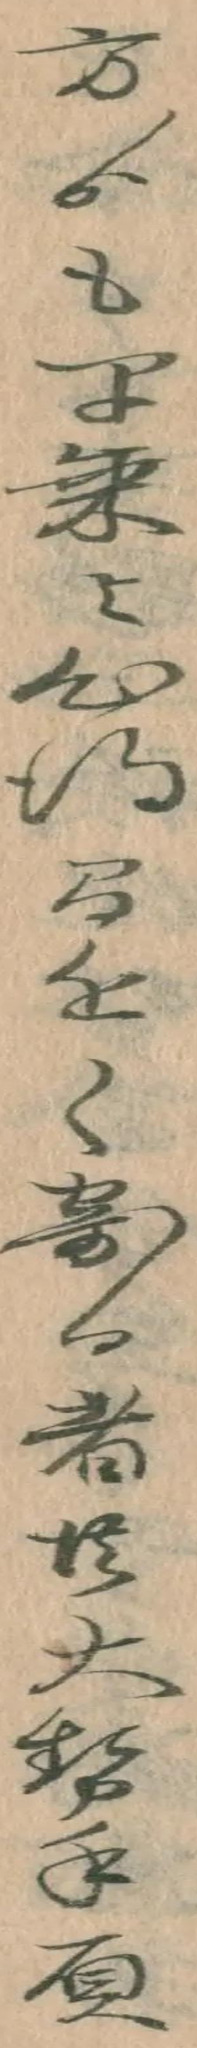方ゟも早乗与心得間近く寄る者共大勢手負
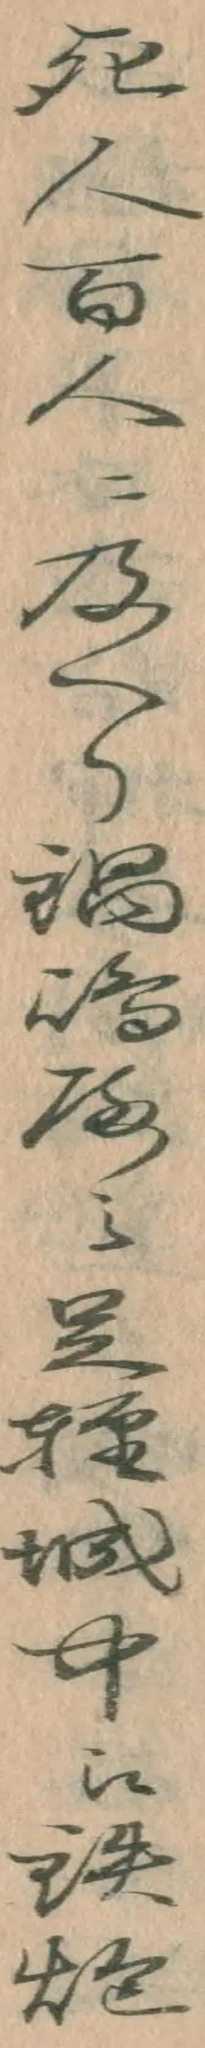死人百人に及へり鍋島殿之足軽城中江鉄炮
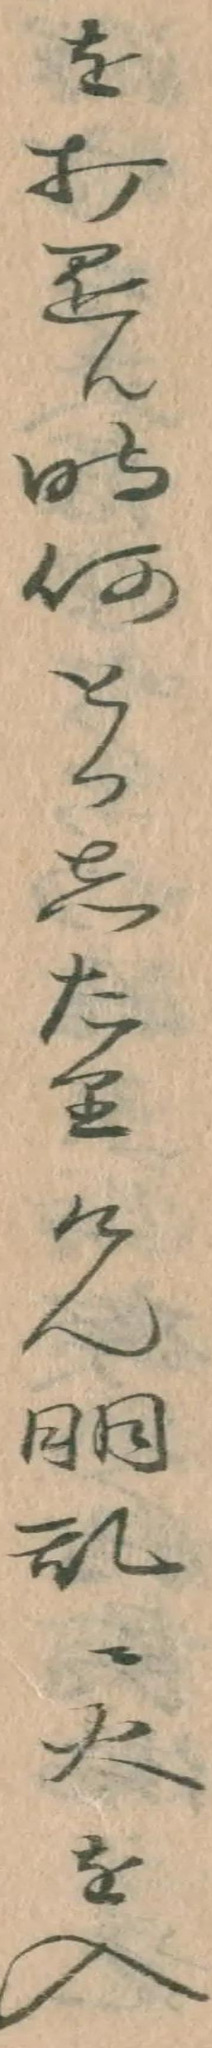を打懸ん時何とか志た里けん胴乱に火を入
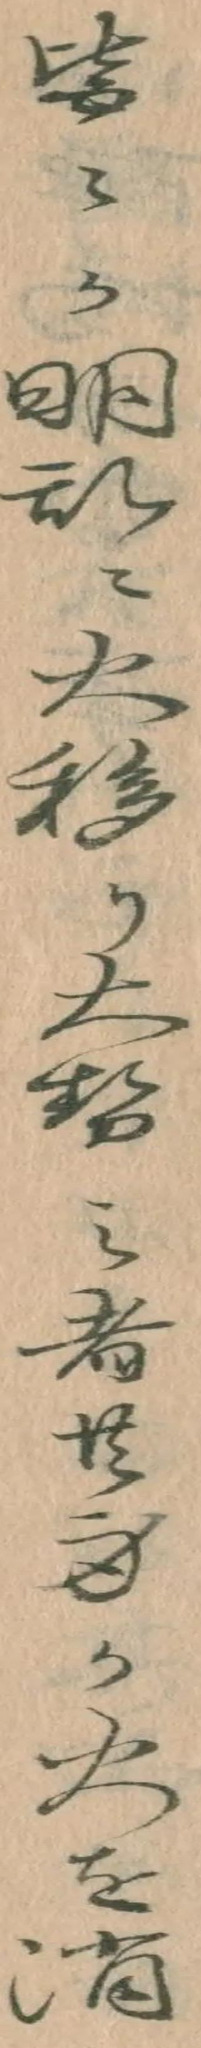皆々か胴乱に火移り大勢之者共身か火を消
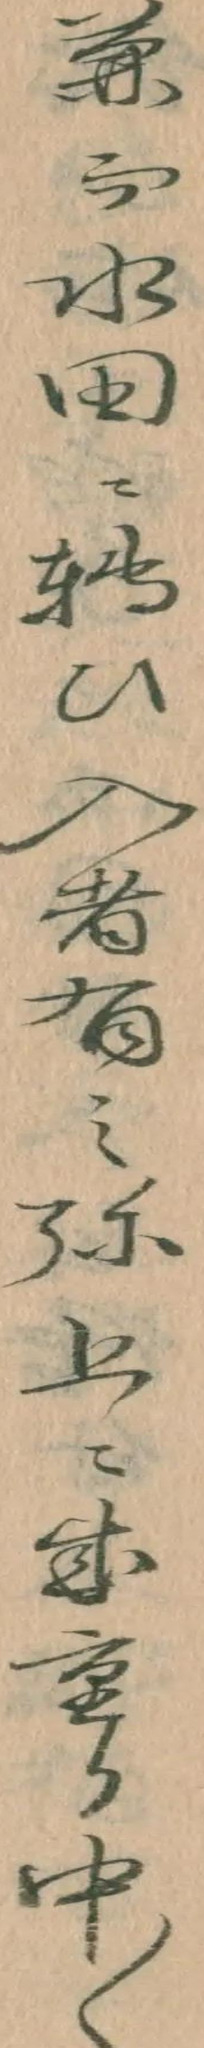兼而水田に転ひ入者有之弥上に成重り中々
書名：切支丹御退治記 49巻. [4]
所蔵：国立国会図書館 National Diet Library, JAPAN
